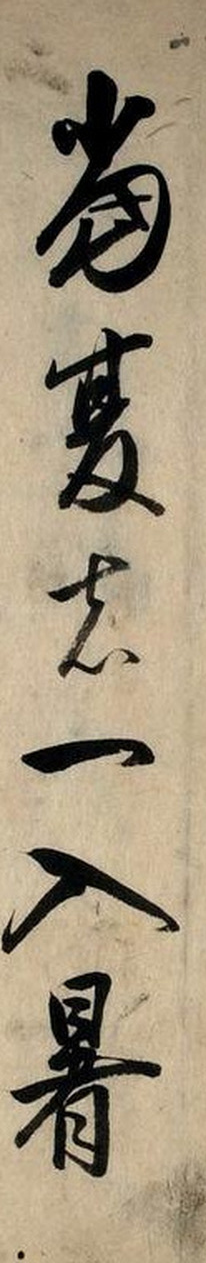当夏は一入暑
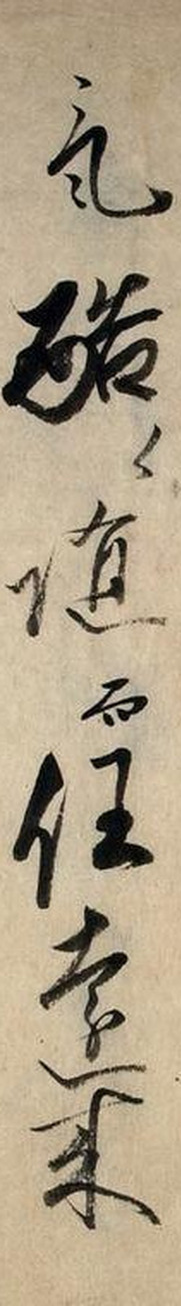気酷候随而任遠来
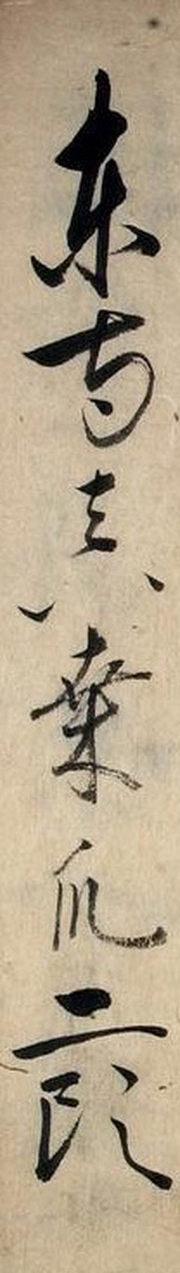東寺真桑瓜二頭

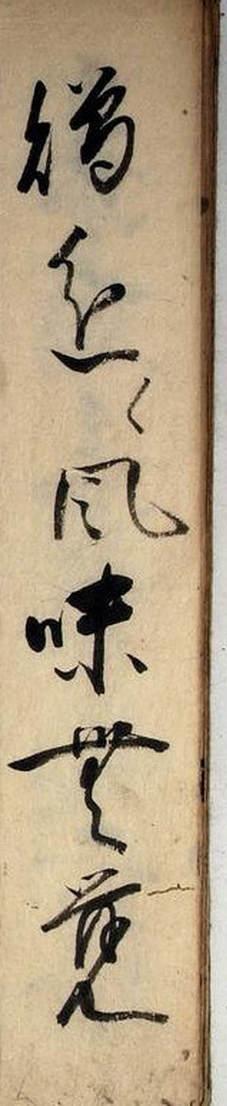贈進候風味無覚
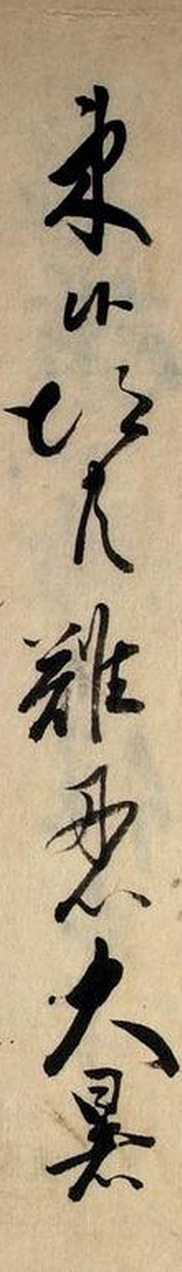束候得共難忍大暑
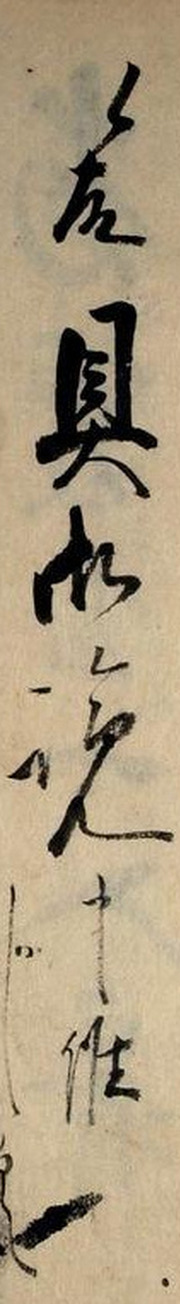候故具御覧申候
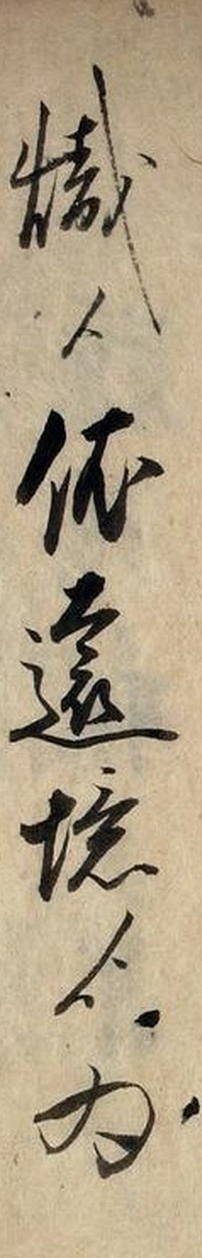熾候依遠境ゟ為
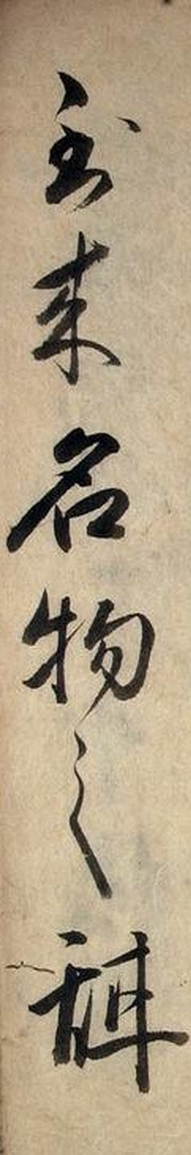至来名物之甜

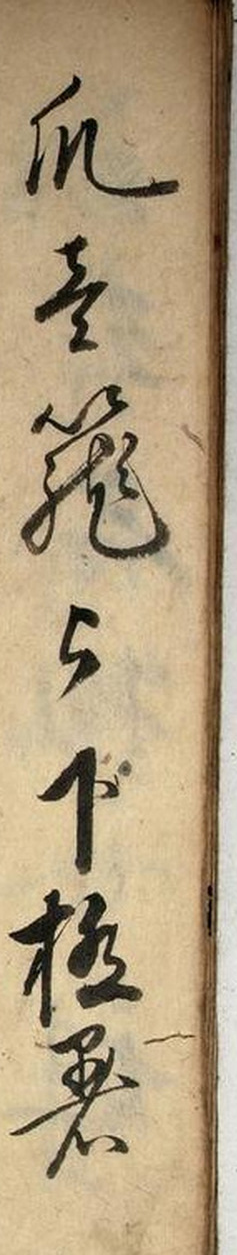瓜壱籠被下極暑
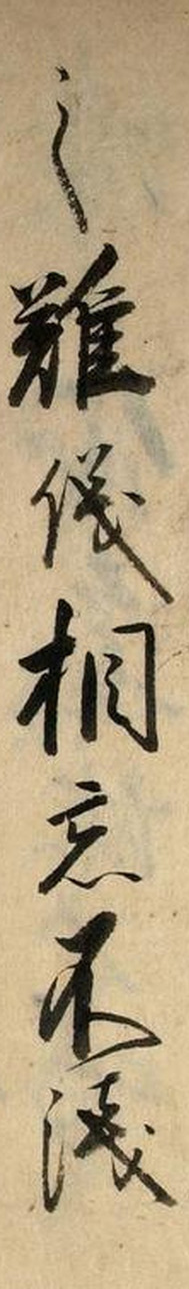之難儀相忘不浅
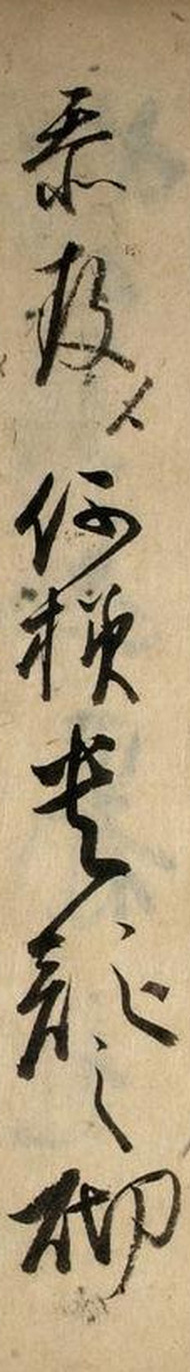忝存候何様貴顔之砌
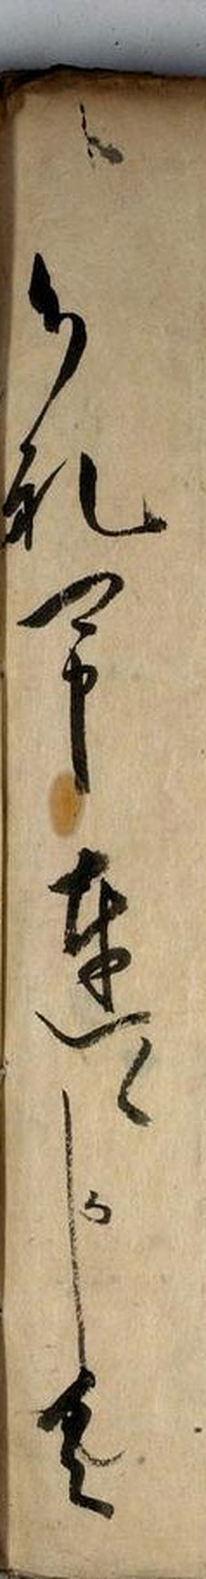御礼可申達候かしく
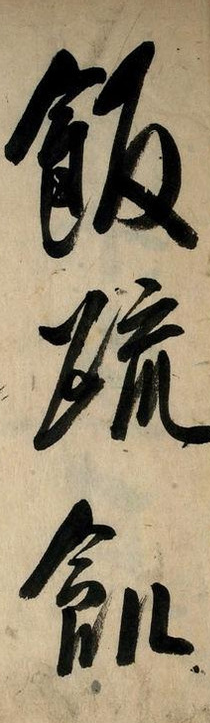飯疏飢
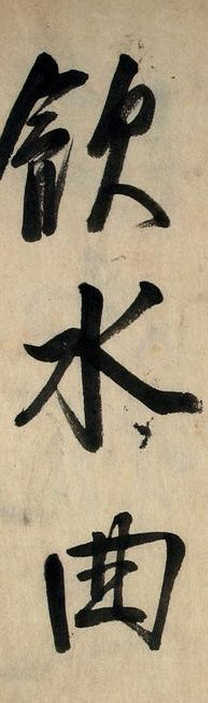飲水曲

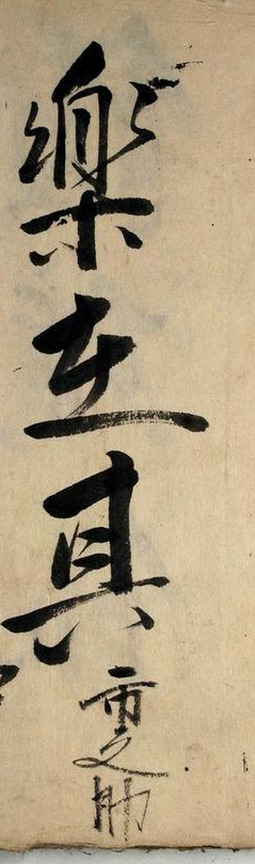楽在其市之助
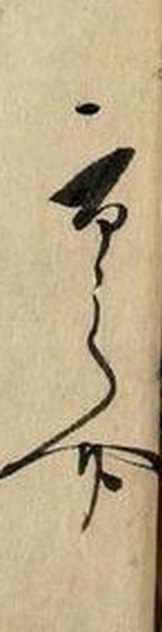市之介
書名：御手本（手習、消息文、和漢朗詠集・論語の一節）
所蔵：福井県文書館 Fukui Prefectural Archives
